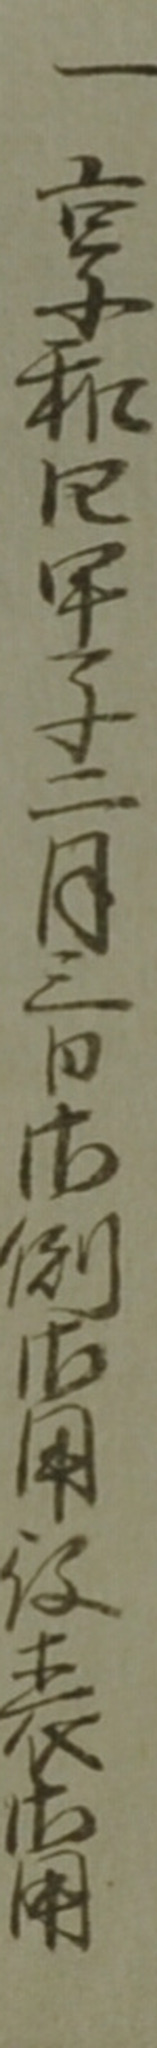一享和四甲子二月三日御側御用役表御用
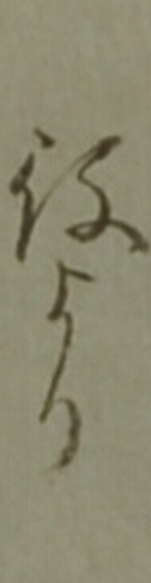役より
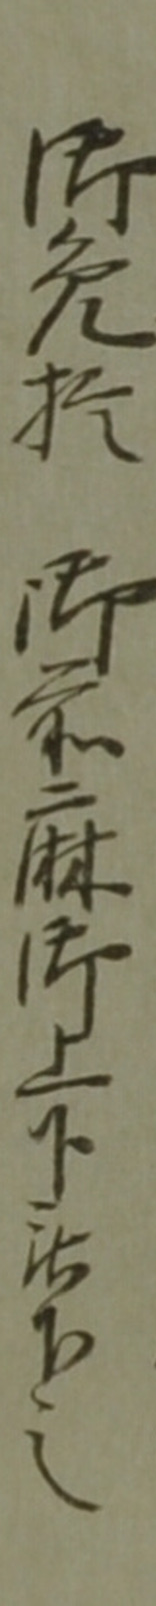御免於御前麻御上下被下之
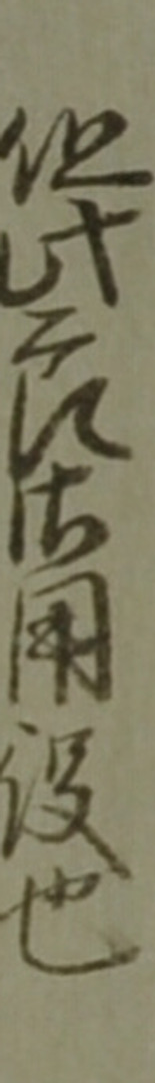但此節御用役也
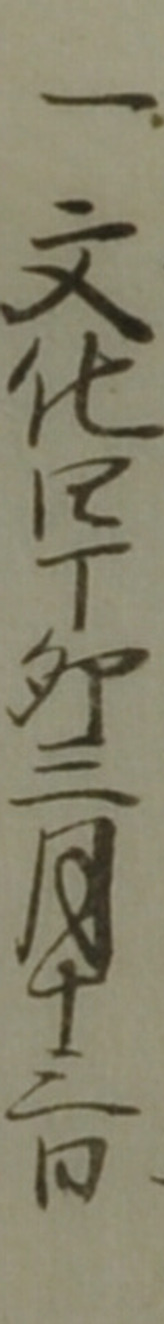一文化四丁卯三月十三日
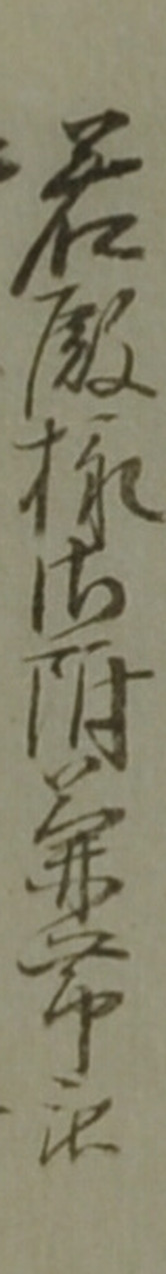若殿様御附兼帯
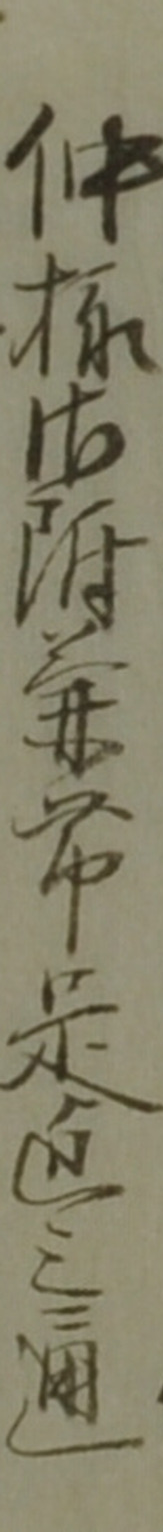仲様御附兼帯是迄之通
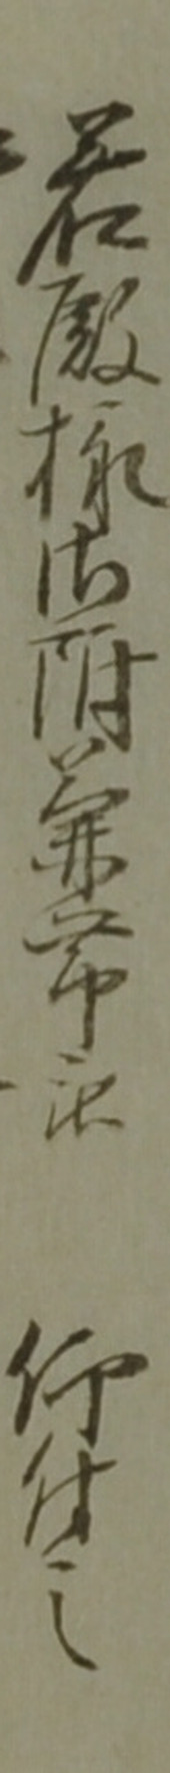若殿様御附兼帯被仰付之
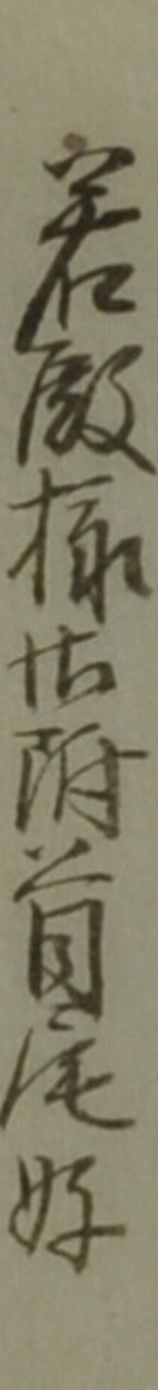若殿様御附首尾好御免
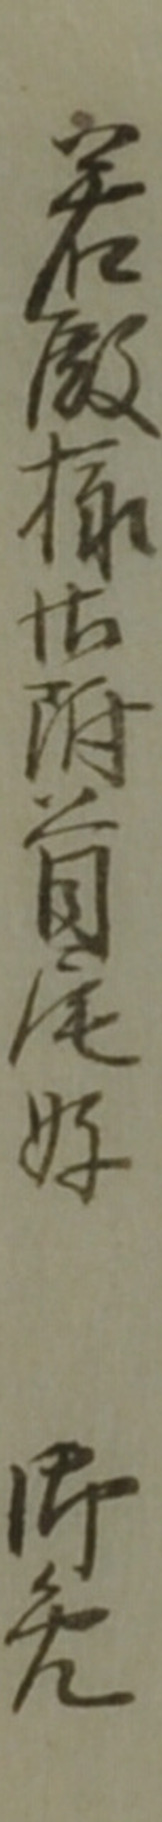若殿様御附首尾好御免
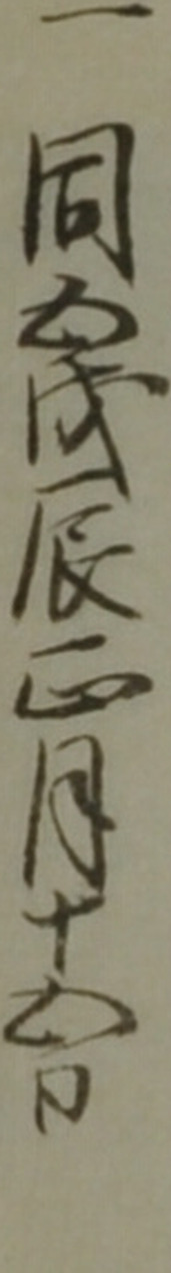一同五戊辰正月十五日
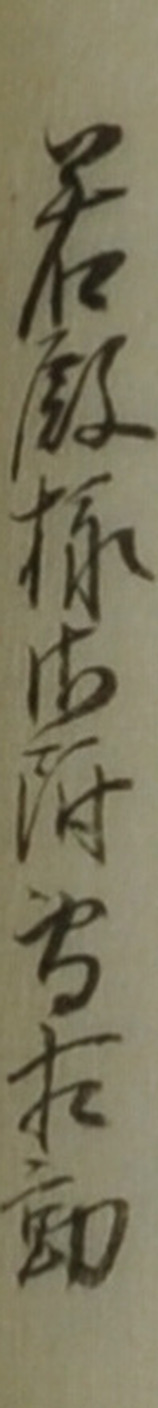若殿様御附専相勤
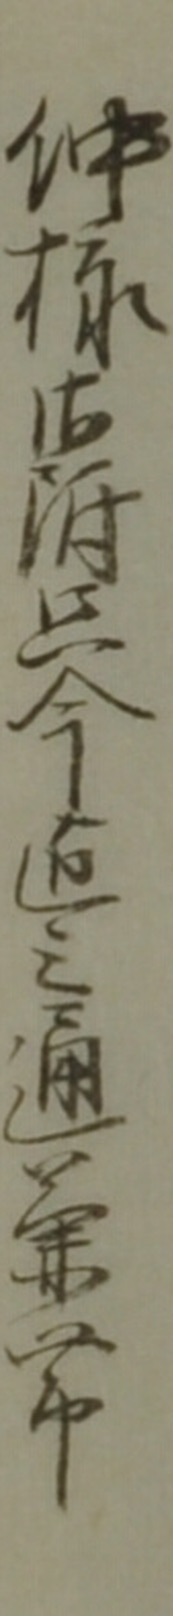仲様御附只今迄之通兼帯
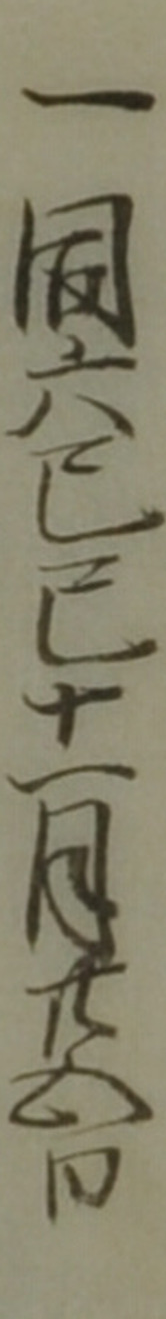一同六己巳十一月廿五日
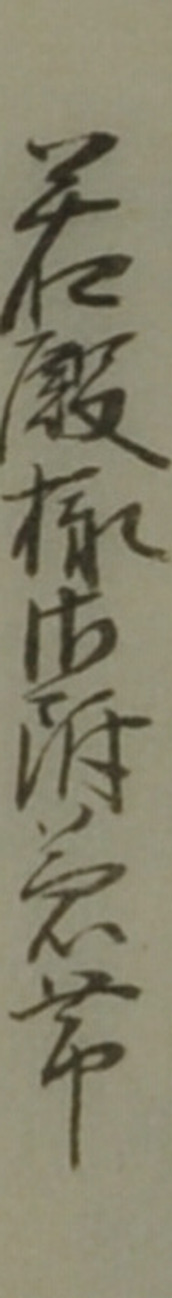若殿様御附兼帯
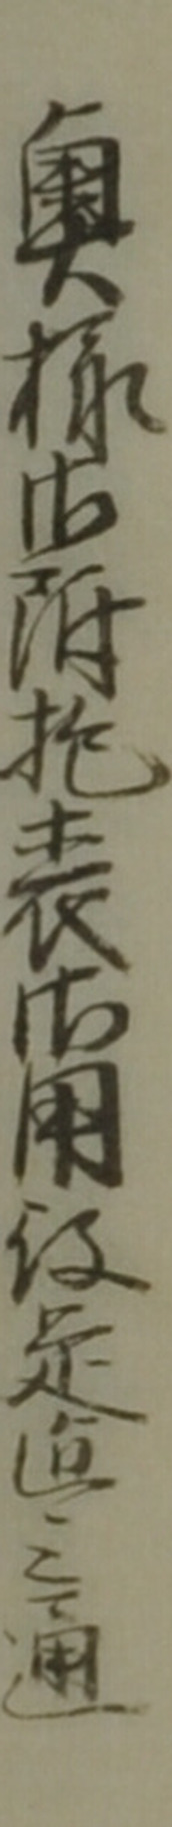奥様御附抱表御用役是迄之通
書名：諸御役代々録（六）
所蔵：伊那市立高遠町図書館・合同会社AMANE
